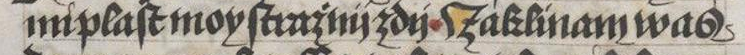mi plaẛt moy ſtrażnij zdij.Zaklínam was
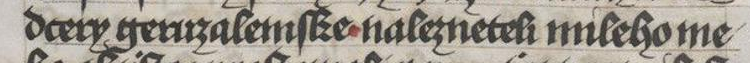dcery geruczalemſke.nalezneteli mileho me¬
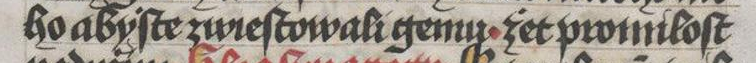ho abyẛte zwieſtowalí gemu.žet promiloſt
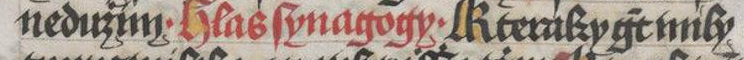nedużím.Hlas ſynagogy.Kteraky ḡt míly
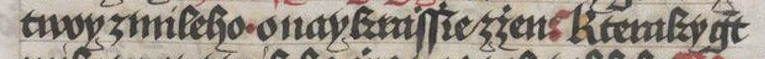twoy zmileho.onaykraẛẛie. zżen?Kteraky ḡt
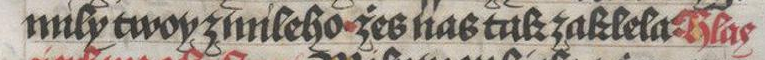mily twoy zmileho.żes nas tak zaklela?Hlas
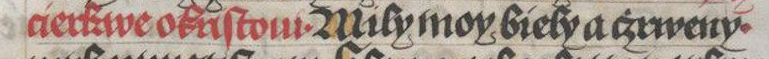cíerkwe okriſtoui.Mily moy bíely a cżrweny.
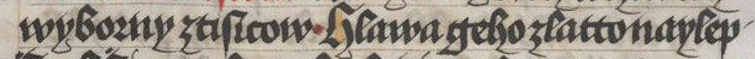wyborny ztiſicow.Hlawa geho zlatto naylep¬
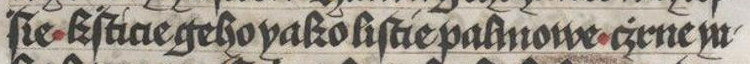ẛie.kẛticie geho yako liſtíe palmowe.cżrne ya¬
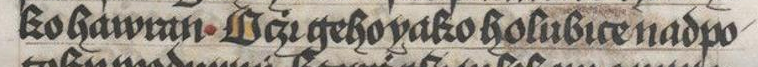ko hawran. Ocżi geho yako holubice nadpo¬
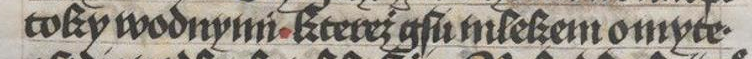toky wodnymi.ktereż gſu mlekem omyte.
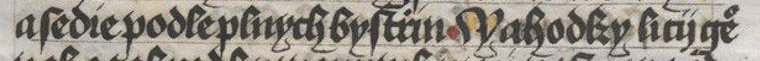aſedíe podle plnych byſtṙín.Yahodky licij geo
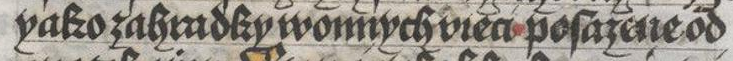yako zahradky wonnych viecí.poſazene od
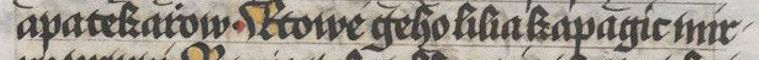apatekṙow. Rtowé geho lilia kapagíc mír¬
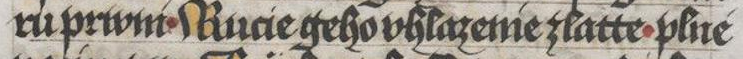ru prwní.Rucie geho vhlazeníe zlatte.plné
